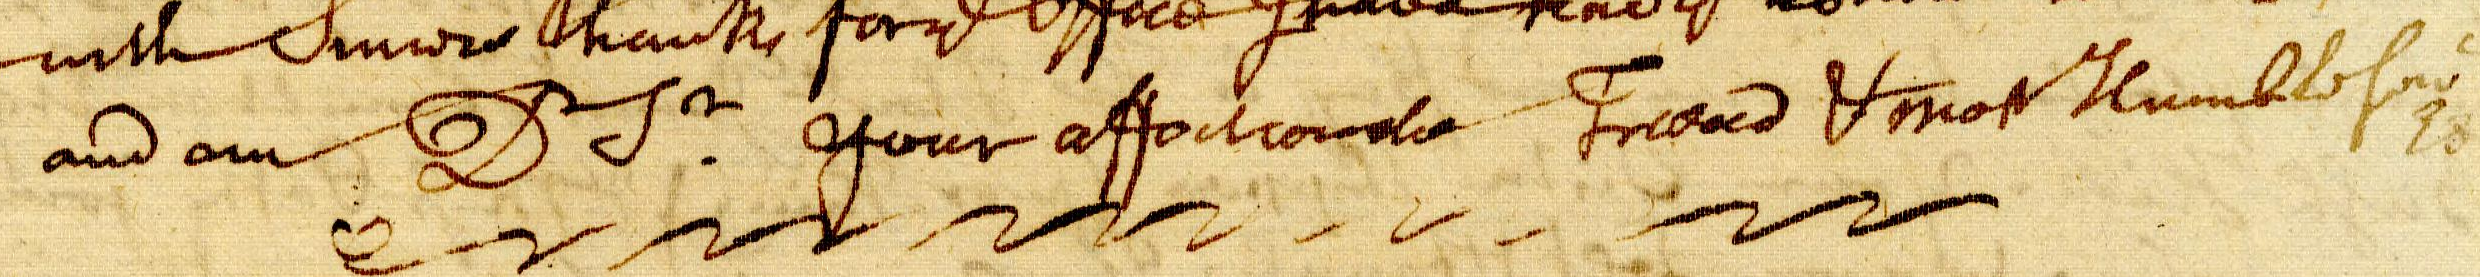and on D^r S^r. Your affectionate Friend & most Humble Serv^t.
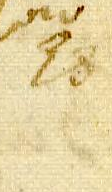ES
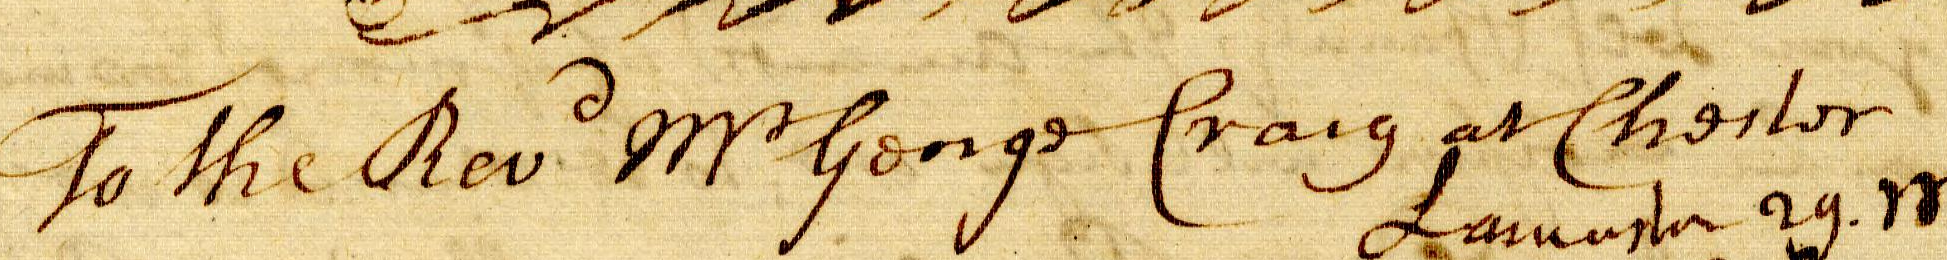To the Rev^d M^r George Craig at Chester
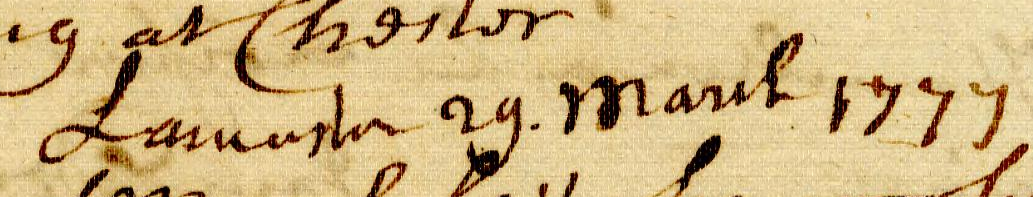Lancaster 29. March 1777
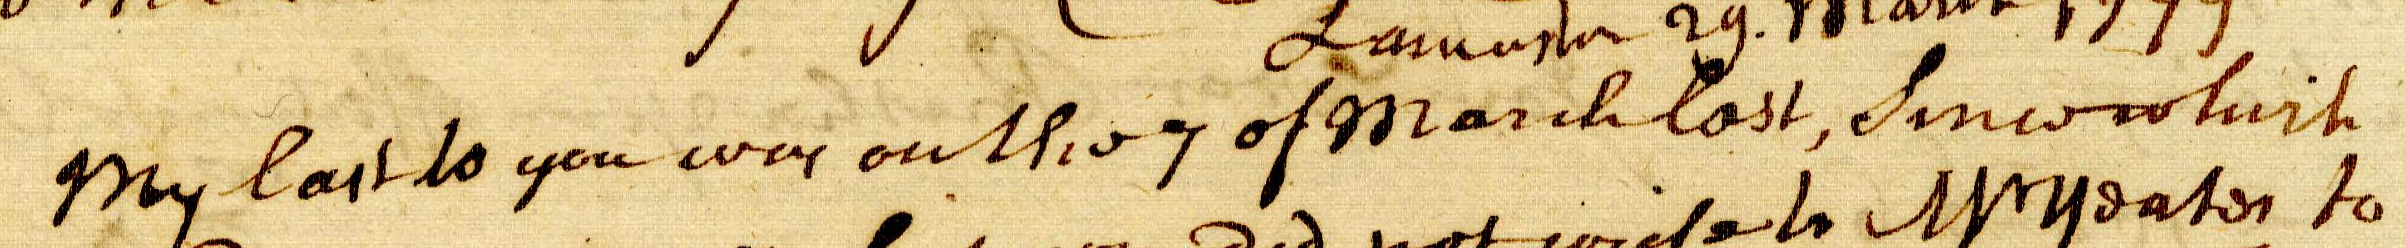My last to you was on the 7 of March last, Since which
